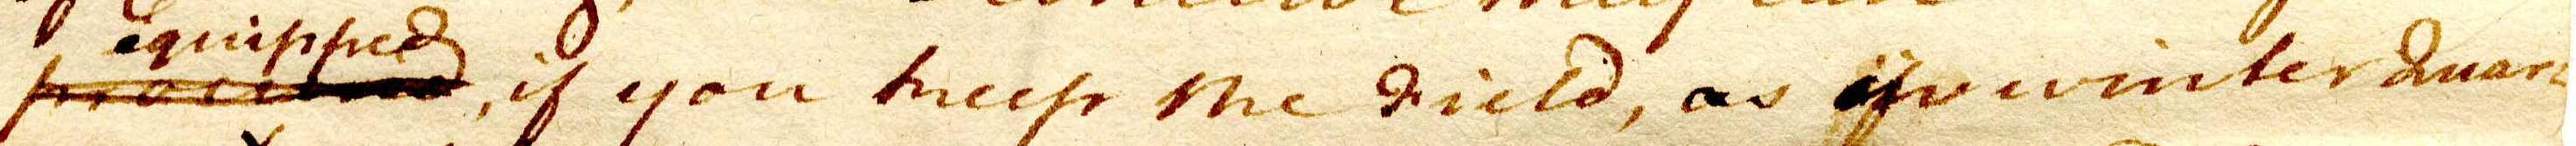[provided], if you keep the Field, as of winter Quart
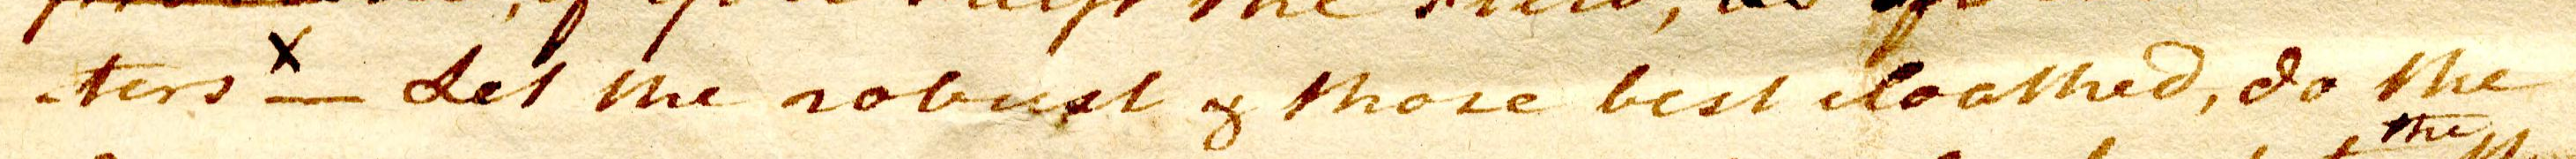-ters^x- Let the robust & those best cloathed, do the
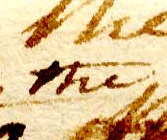the
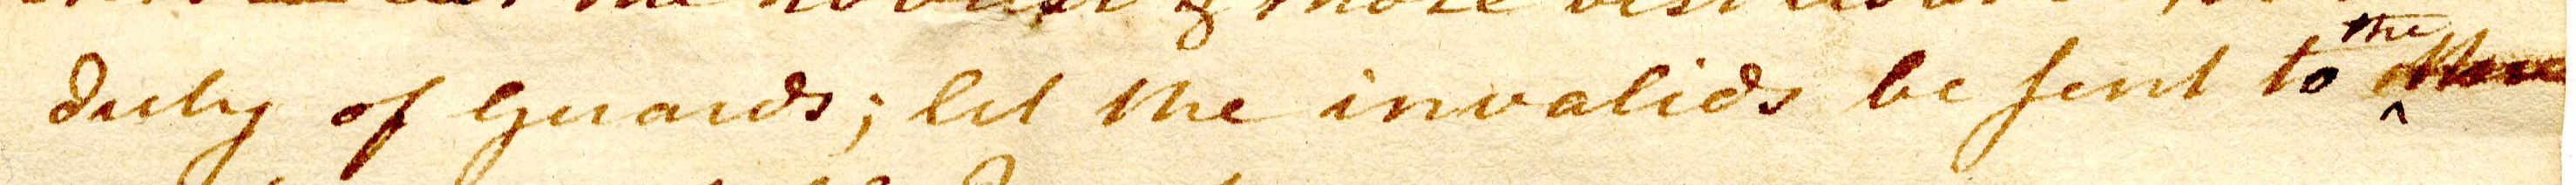duty of Guards; let the invalids be sent to [___]
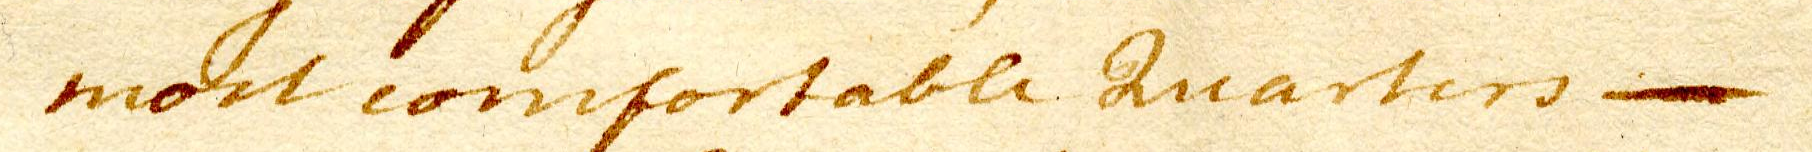most comfortable Quarters-
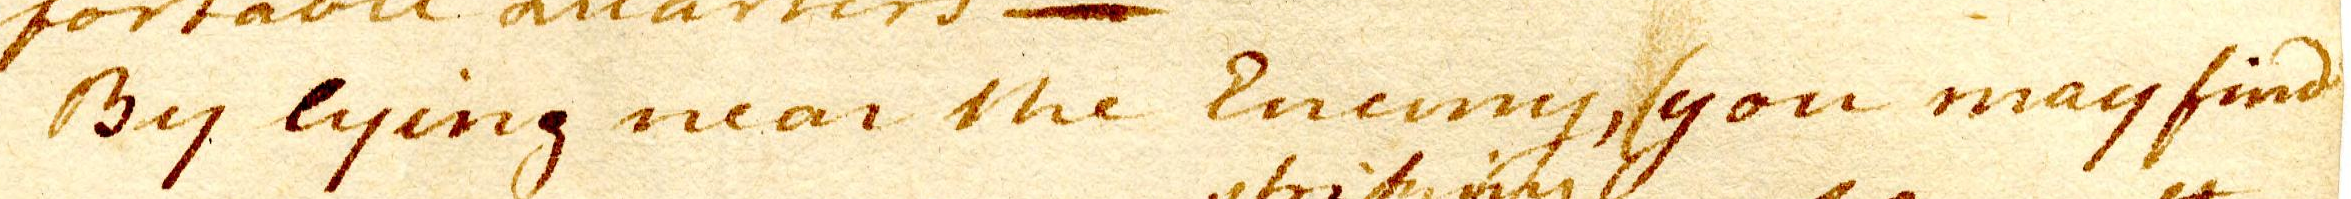By lying near the Enemy, (you may find
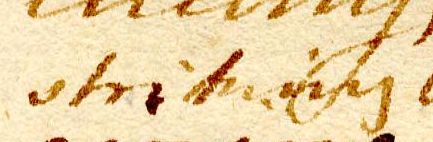striking
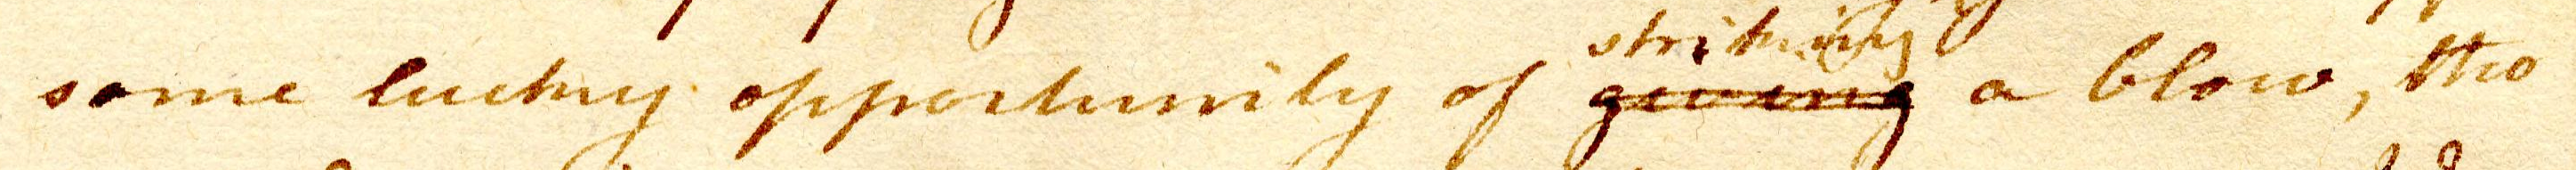some lucky opportunity of [giving] a blow, tho
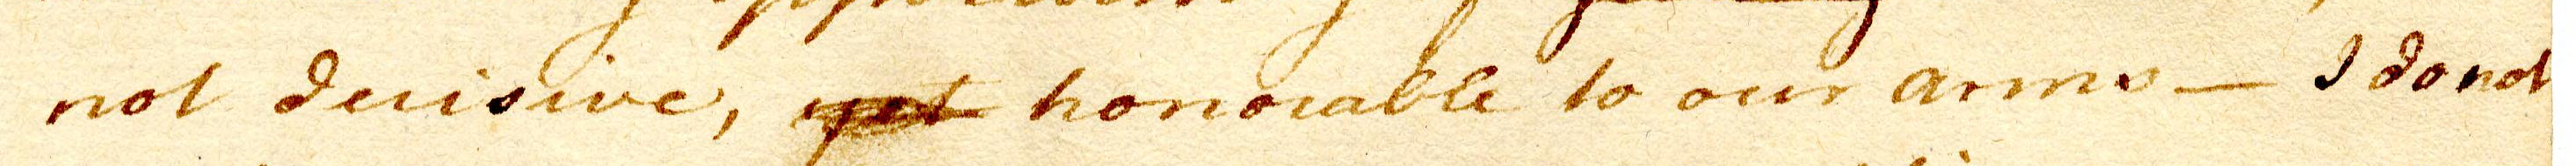not derisive, [yet] honorable to our arms- I do not
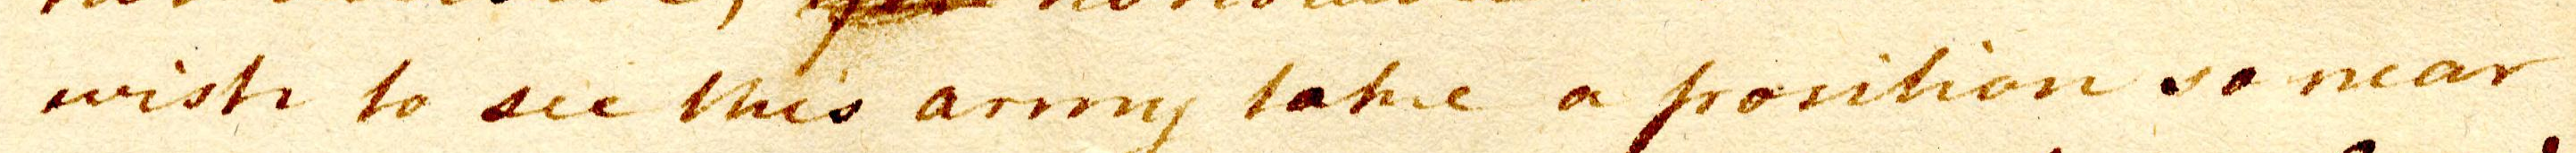wish to see this army take a position so near
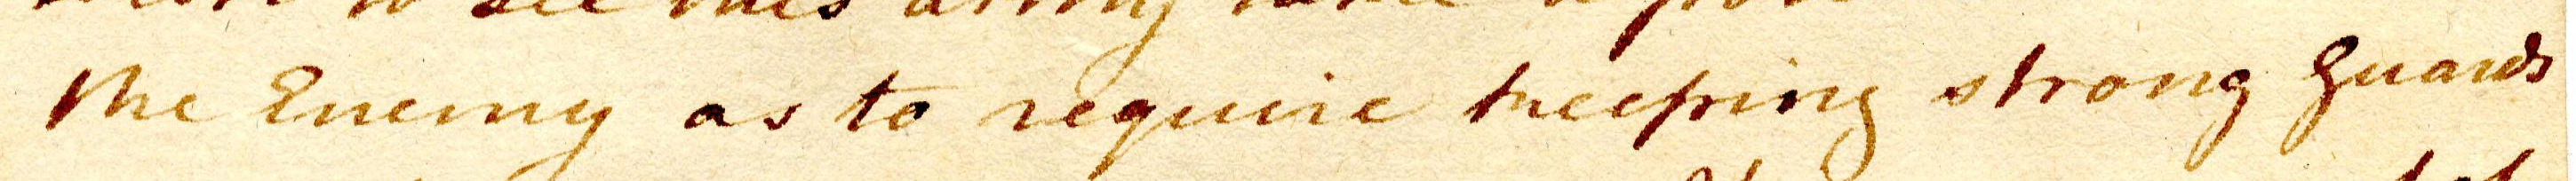the Enemy as to require keeping strong Guards
